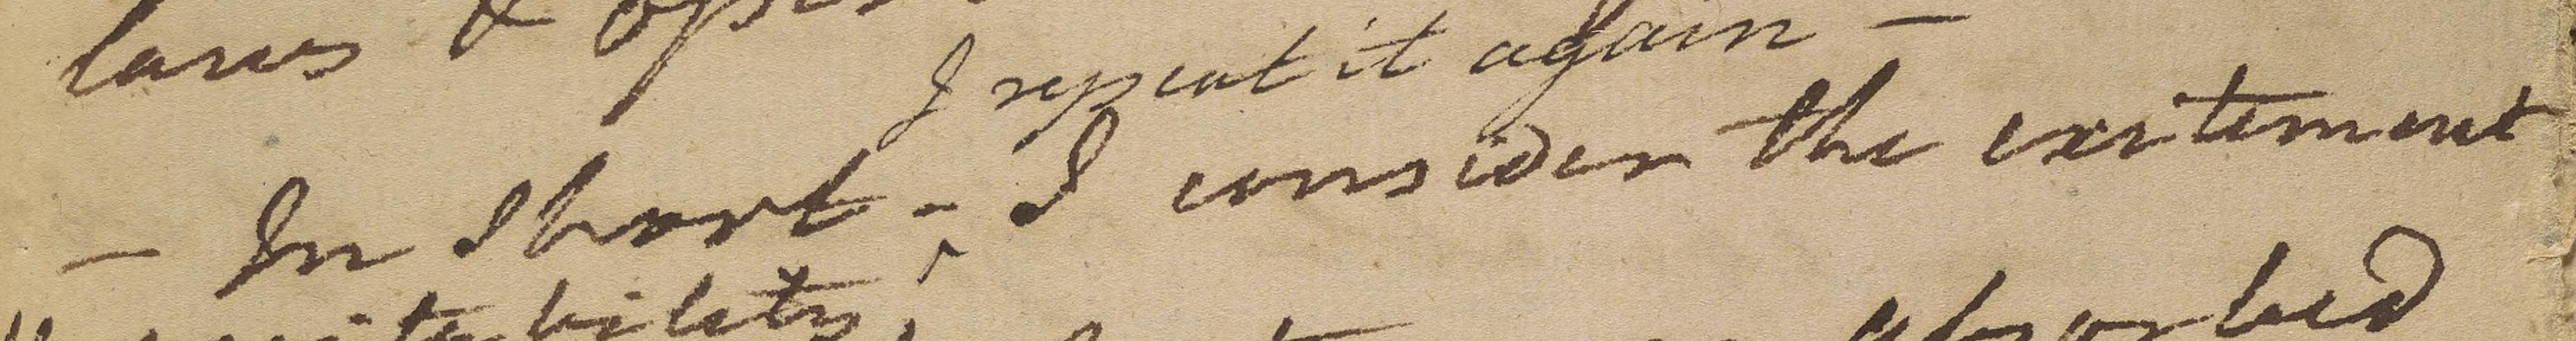- In short, ^ I consider the excitement
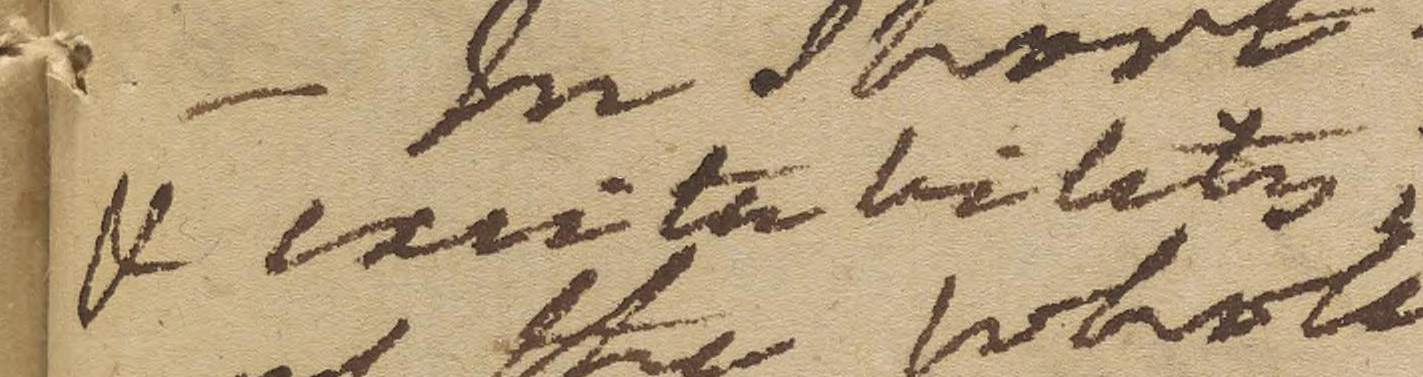& excitability
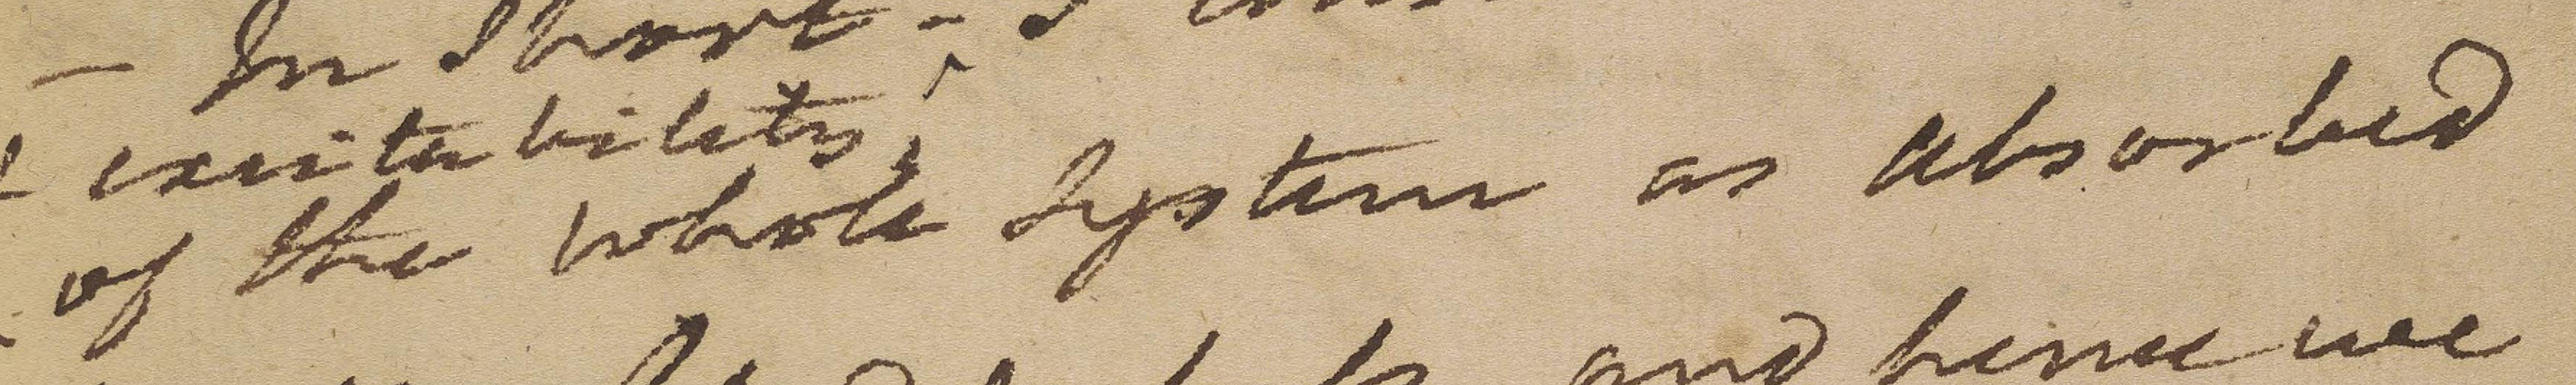^ of the whole system as absorbed
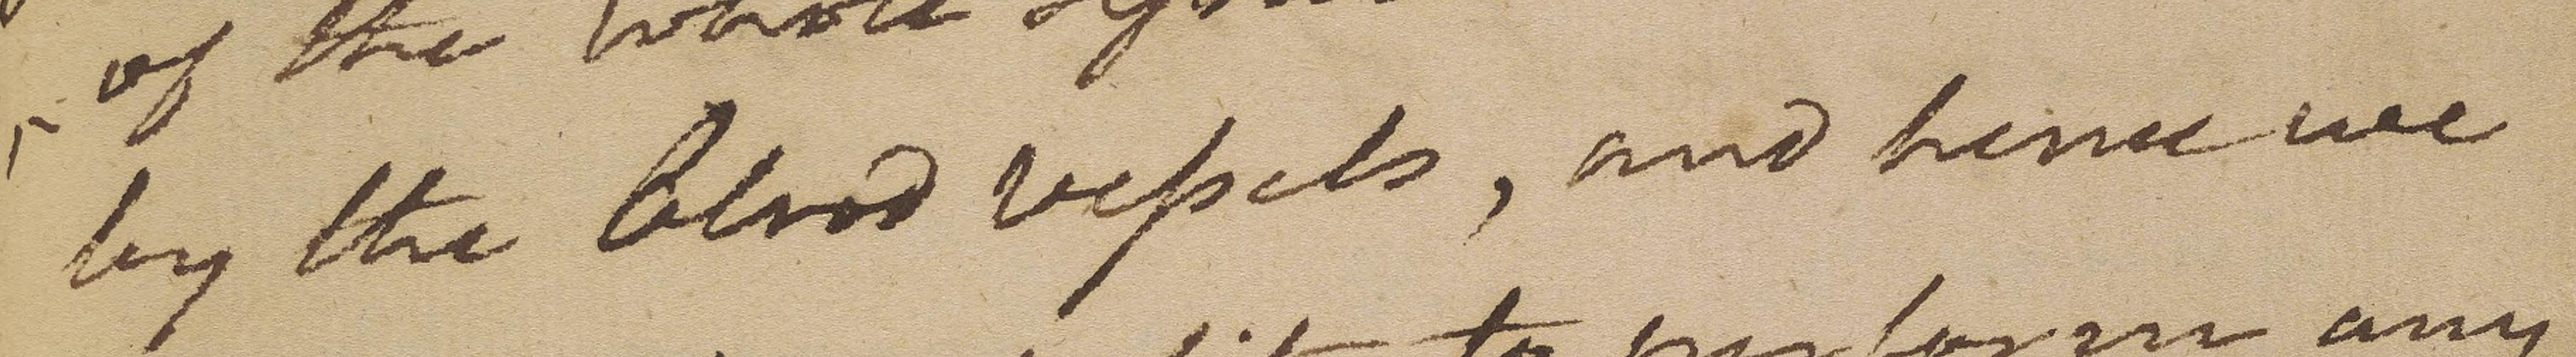by the blood vessels, and hence we
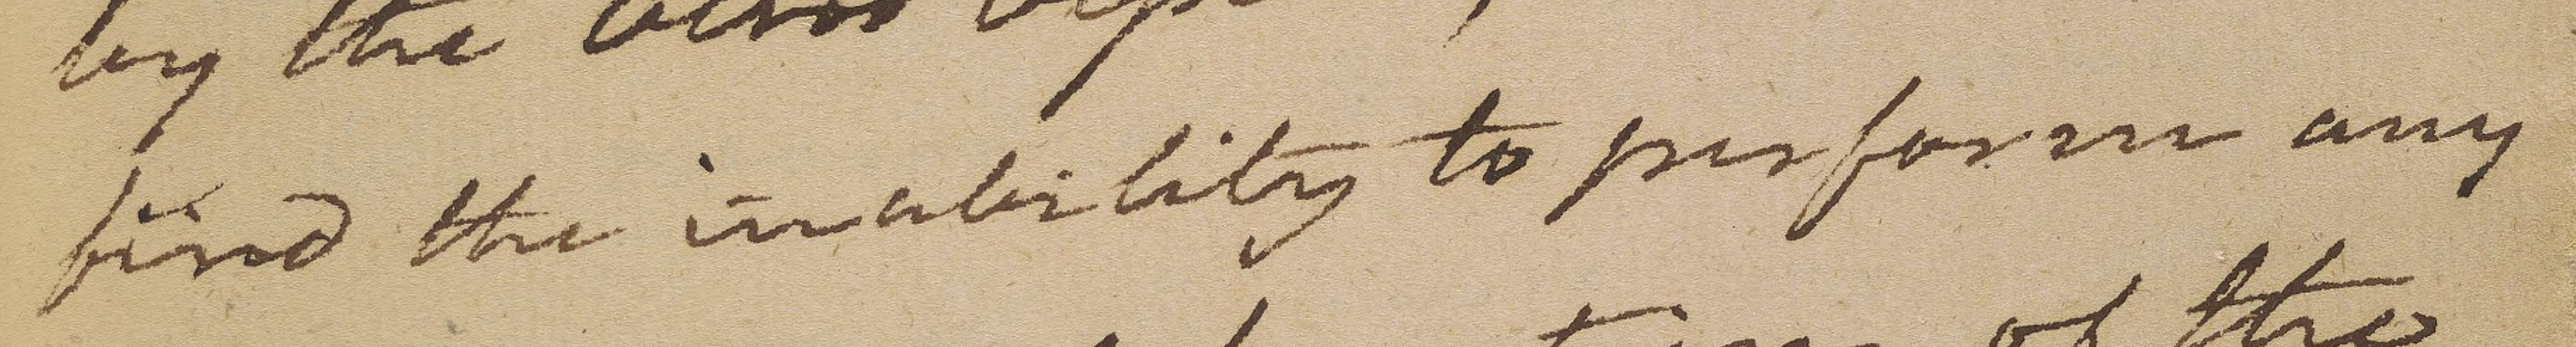find the inability to perform any
